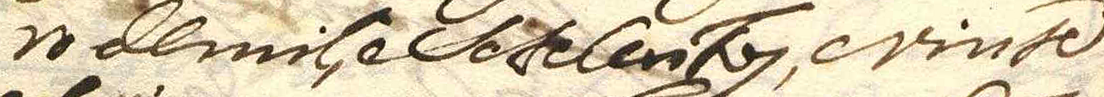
ro de mil, e Setecentos, e vinte
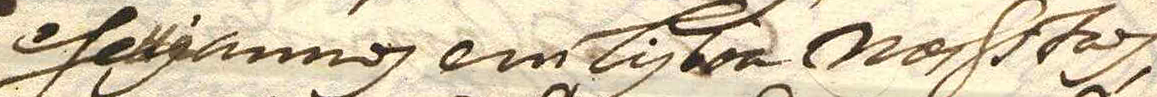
e sette annos em lisboa nos estaos,
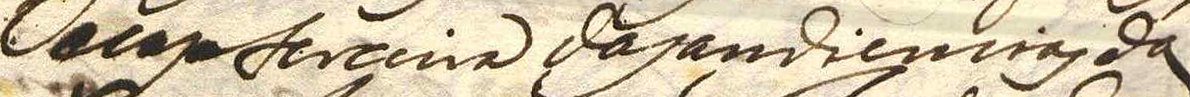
e casa terceira das audiencias da
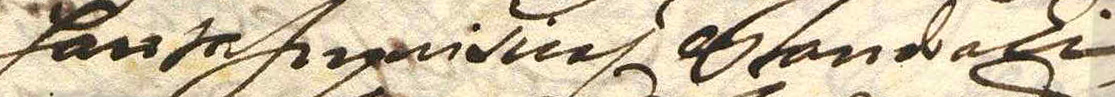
santa Jnquisiçaõ estando ahi
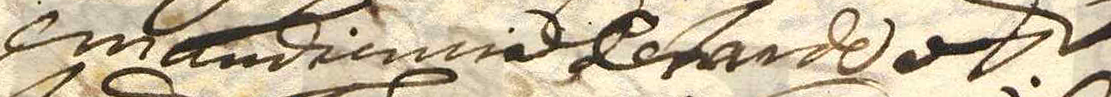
em audiencia de tarde o s.or
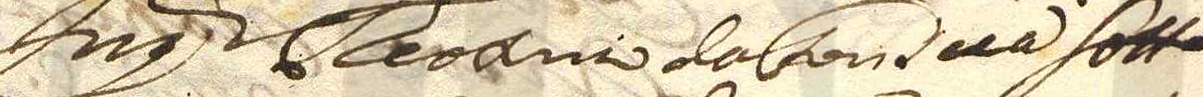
Jnq.or Theotonio da Fonseca sotto
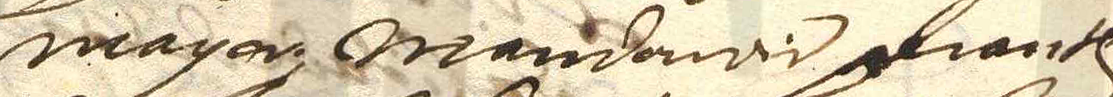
mayor; mandou vir perante
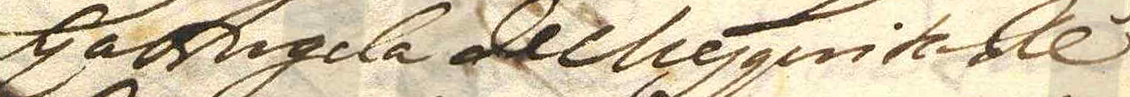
sy a Angela de Mesquita Re
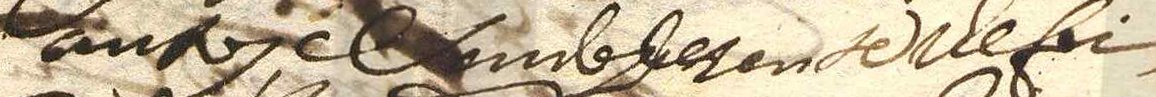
autos, e Sendo prezente lhe foi
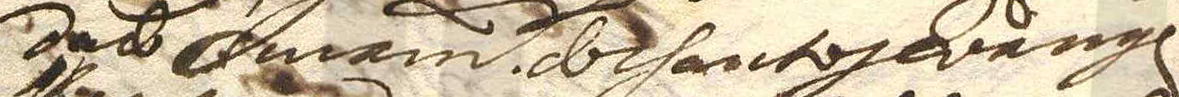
dado Juramento dos sanctos Evange
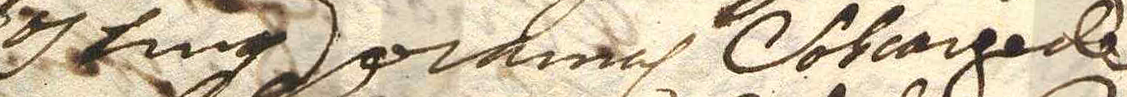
lhos em q̄ pos a maõ Sob cargo de
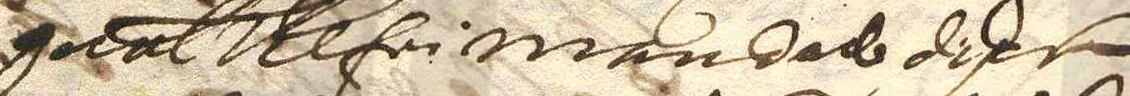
qual lhe foi mandado dizer
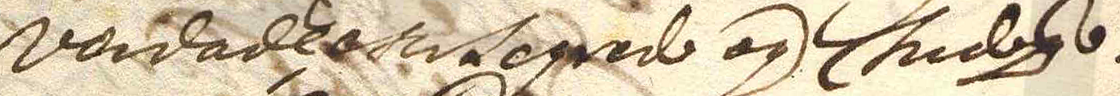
verdade, e ter segredo o q̄ tudo pro
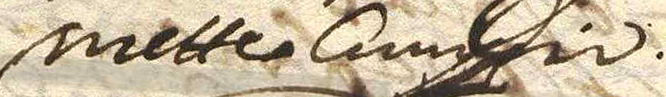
metteo cumprir.
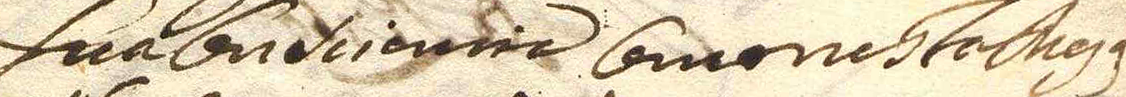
sus consciencia como nesta Mesa
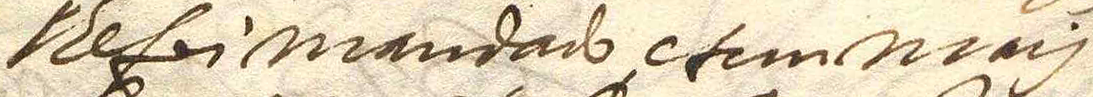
lhe foi mandado, e tem mais
